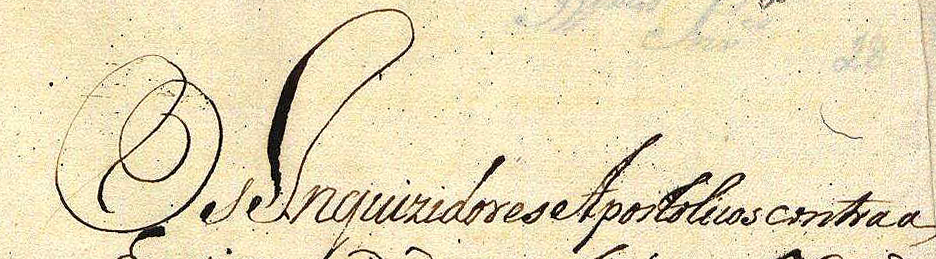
Os Inquizidores Apostolicos contra a
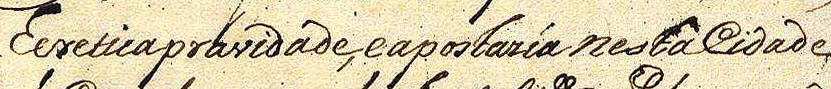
heretica pravidade, e apostazia nesta Cidade
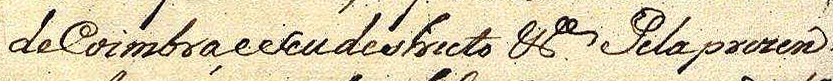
de Coimbra, e seu destricto &ra Pela prezen
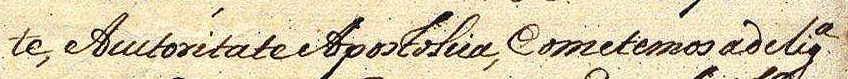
te, Auctoritate Apostolica, Cometemos a delig.a
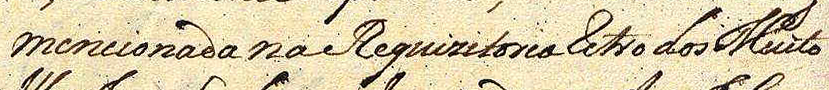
mencionada na Requizitoria Retro dos Muito
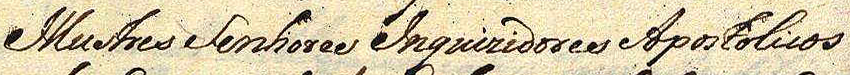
Illustres Senhores Inquizidores Apostolicos
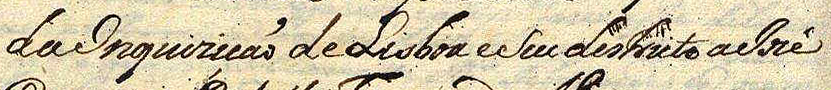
da Inquiziçaõ de Lisboa, e seu destricto a Iozé
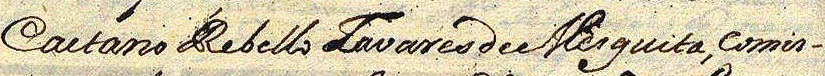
Caetano Rebello Tavares de Mesquita, comis
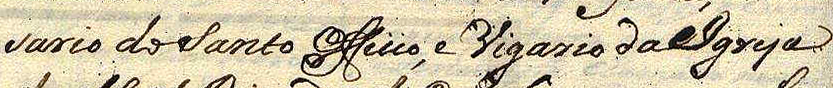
sario do Santo Officio, e Vigario da Igreja
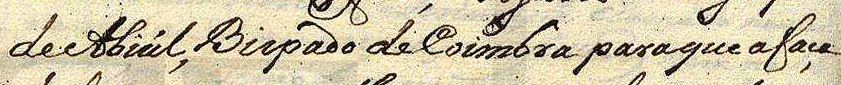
de Abiúl, Bispado de Coimbra para que a faça
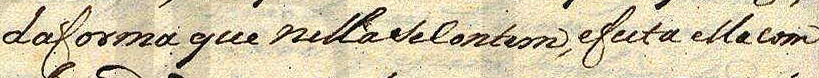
da forma que nella se contem, e feita ella com
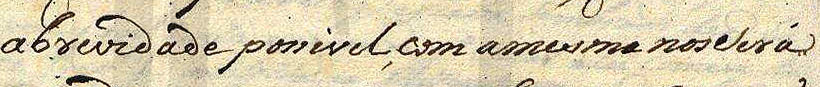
a brevidade possivel, com a mesma nos será
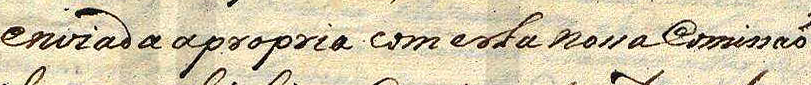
enviada a propria com esta nossa Comissaõ
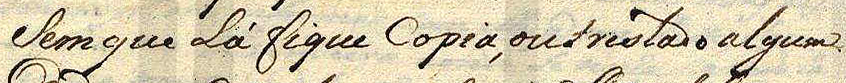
Sem que Lá fique Copia, ou trestado algum
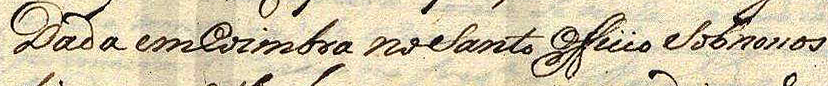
Dada em Coimbra no Santo Officio sob nossos
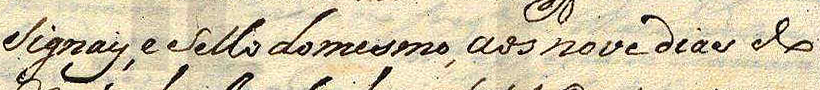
signais, e sello do mesmo, aos nove dias do
